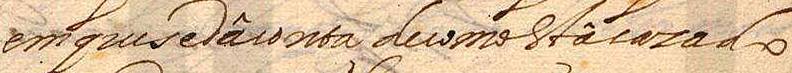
em que se dâ conta de como estâ cazado
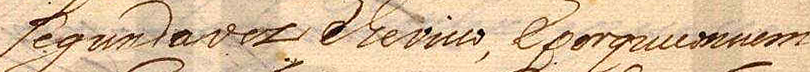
segunda vez E he viuo, E porque conuem
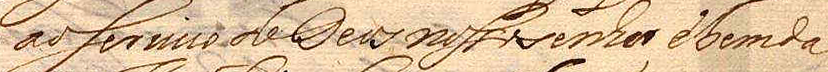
ao Serviço de Deos nosso senhor, e bem da
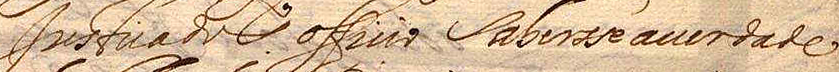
Justica do sto officio sabersse a uerdade
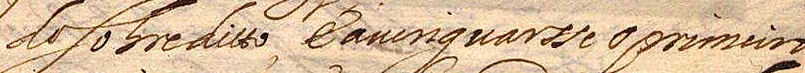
do sobreditto, E a uinguarsse o primeiro
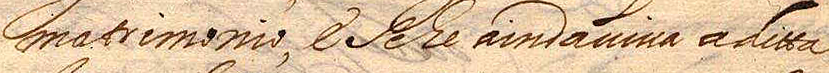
matrimonio, E se he ainda uiua a ditta
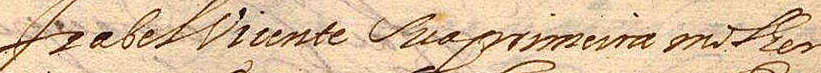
JzabeL Viçente sua primeira molher,
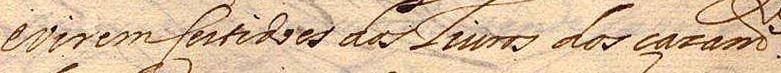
e virem Certidoes dos Liuros dos cazam.tos
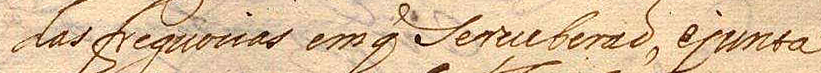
das freguezias em q̄ se receberaõ, e junta
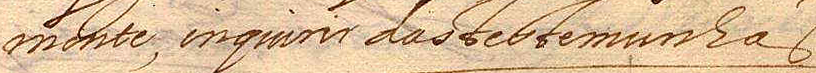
mente, inquirir das testemunhas
